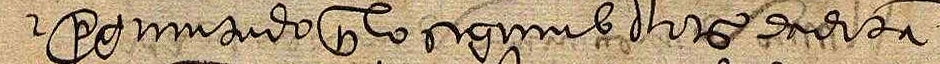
item p̄gumtado pelo segumdo Arto da dita
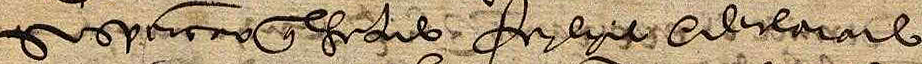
sospeição q̄ lhe todo foy lydo e declarado
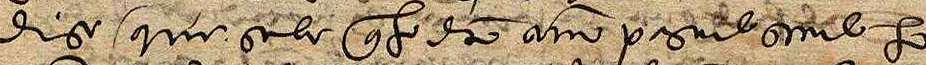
dise que sabe q̄ ho dt̄o an̄o pasado sendo ho
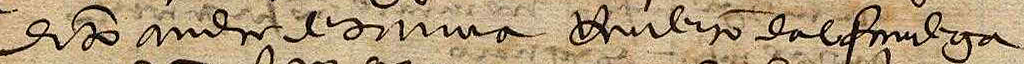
dito andre de tauora Rendeiro dalfamdega
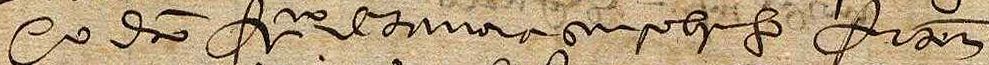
e o dtō frco de tauora seu sobrinho feytor
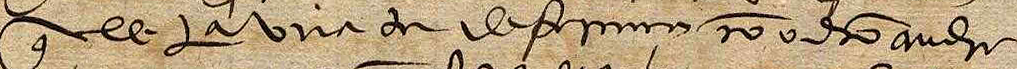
q̄ elle ta vira ter deferença c̄o o dt̄o andre
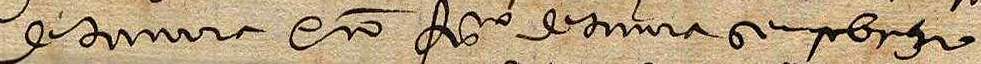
de tauora e c̄o frco de tauora seu sobrinho
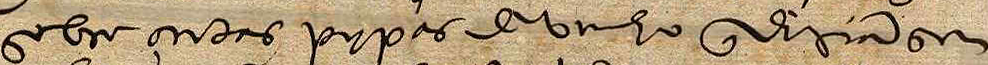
sobre certas pypas de vinho q̄ diziā ser
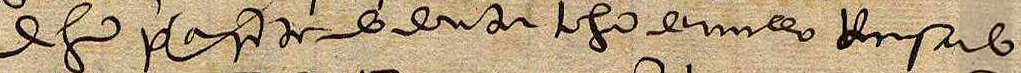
de hū parēte do doutor Johā de mello Recusado
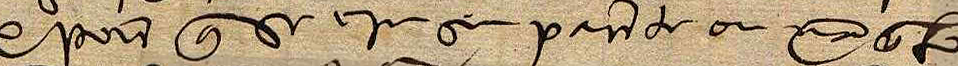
e porē q̄ se era seu parēte ou nā q̄ ho
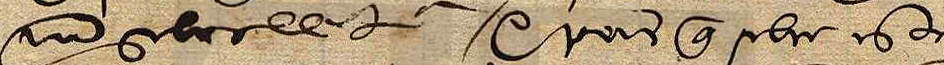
nā sabe elle ta / e porē q̄ sobre esta
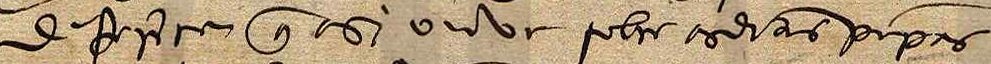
deferēça q̄ asy ouve sobre as ditas pipas
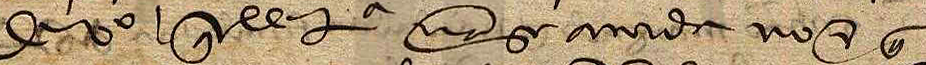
de vo q̄ elle ta nā se acorda no ē q̄
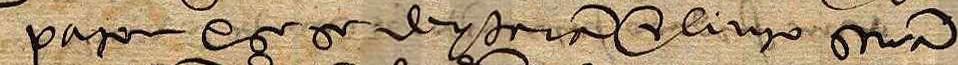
parou e se se deytarā ē liuro se nā
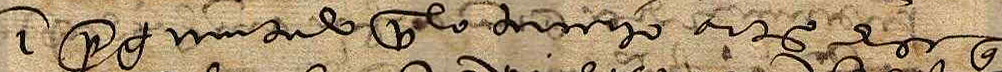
item p̄gumtado p̄lo terceiro arto dise q̄
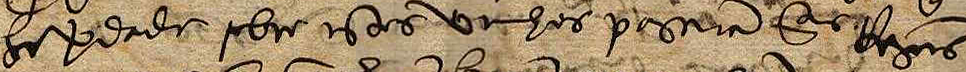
he ꝟdade sobre estes vinhos pasarā mtas Rezões
